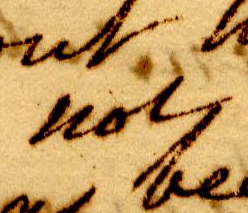not
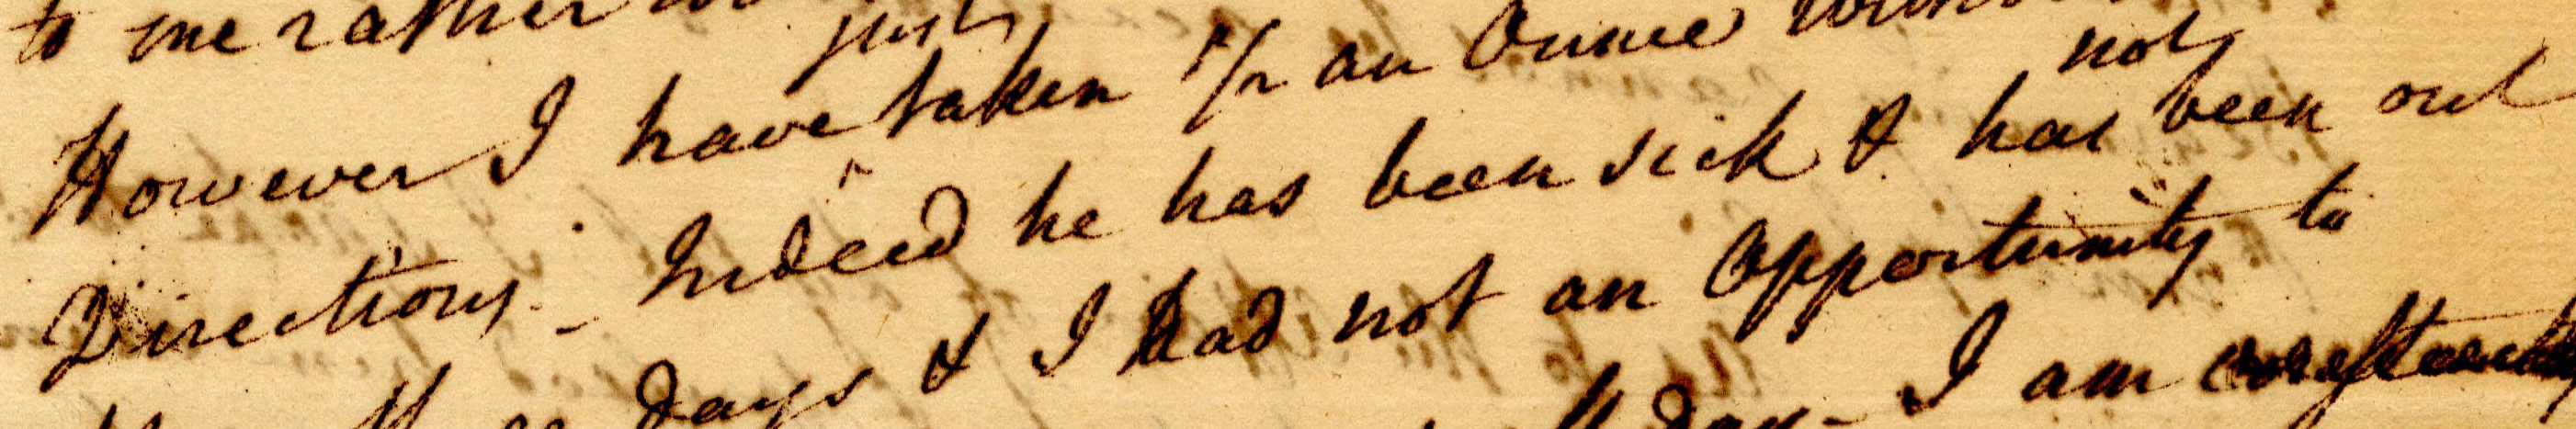Directions. Indeed he has been sick & has ^ been out
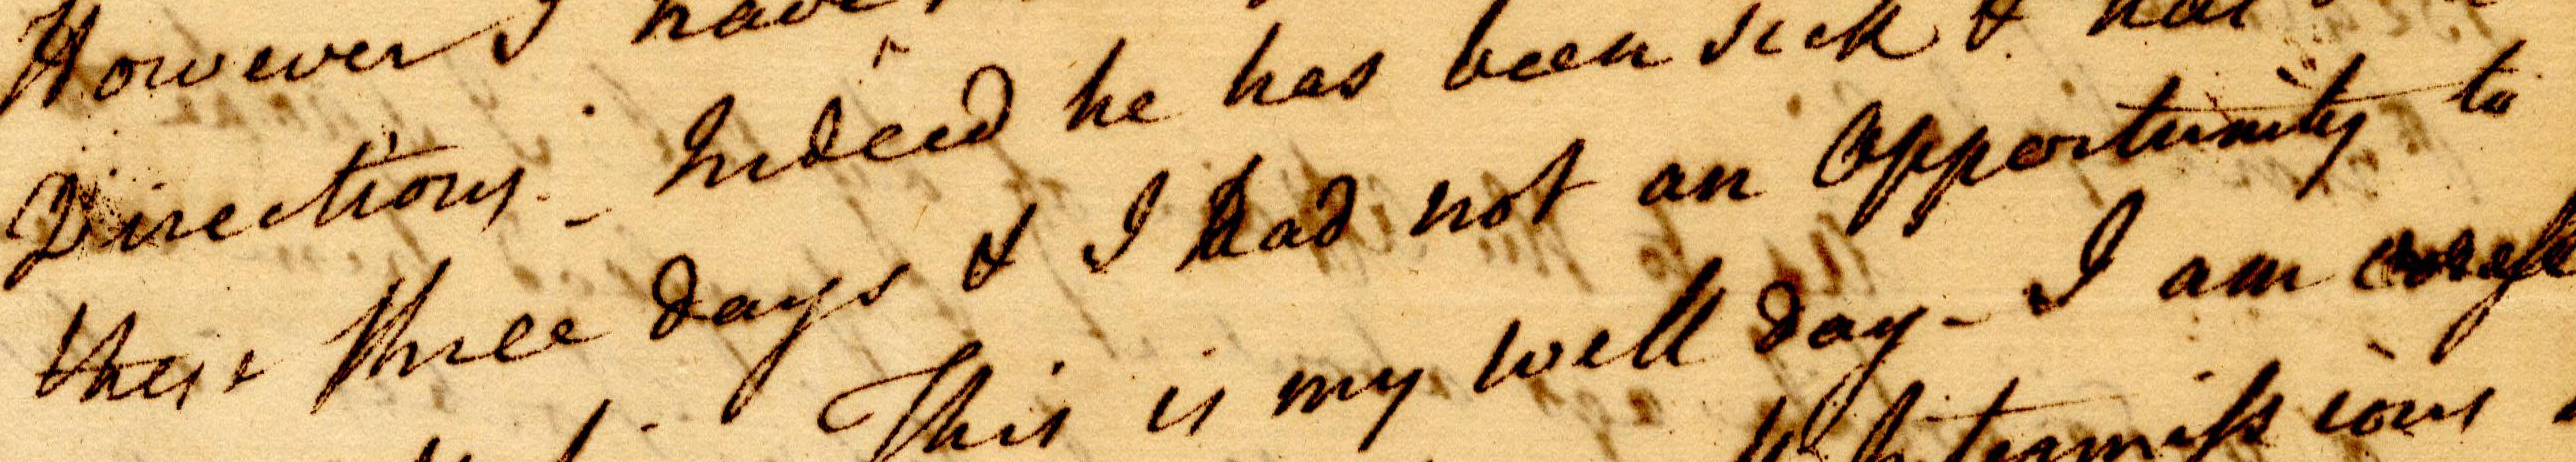these three days & I had not an Opportunity to
